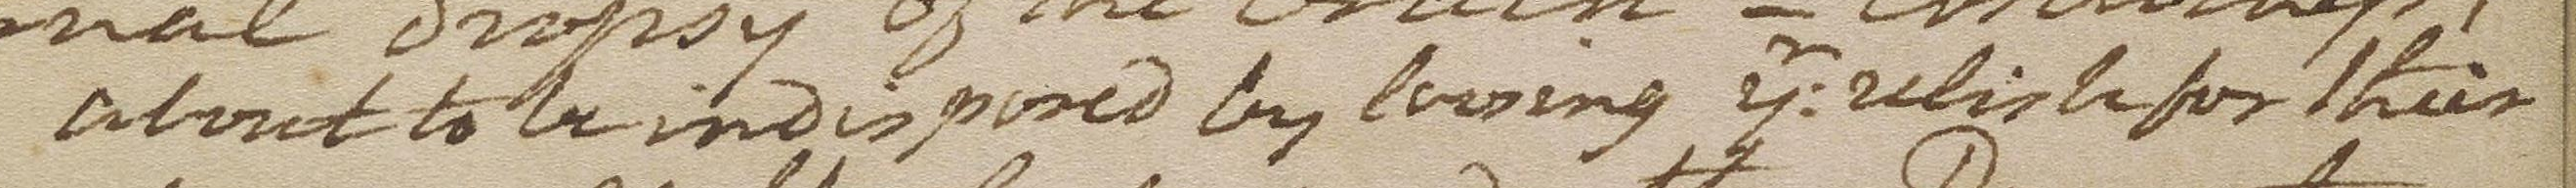about to be indisposed by losing y^r relish for their
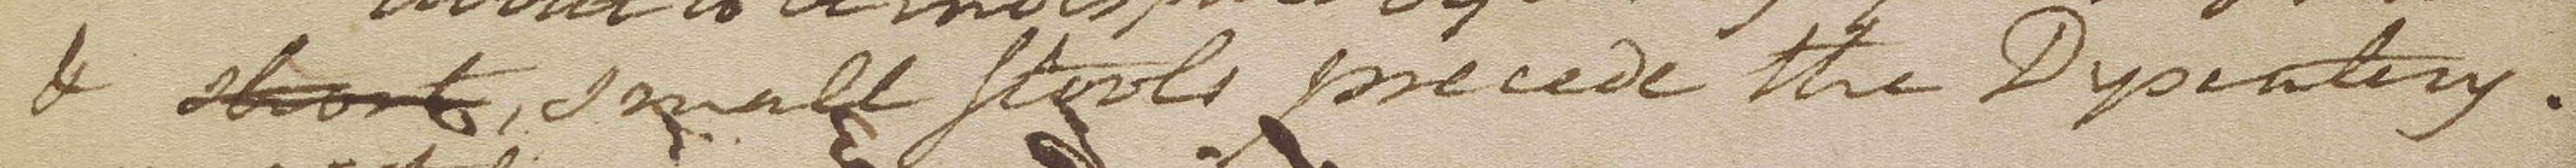& [short] small stools precede the dysentery
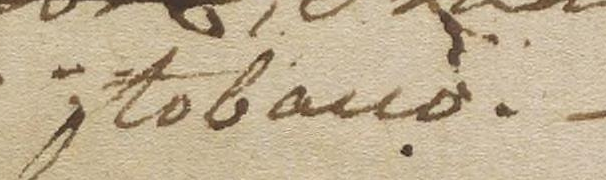tobacco
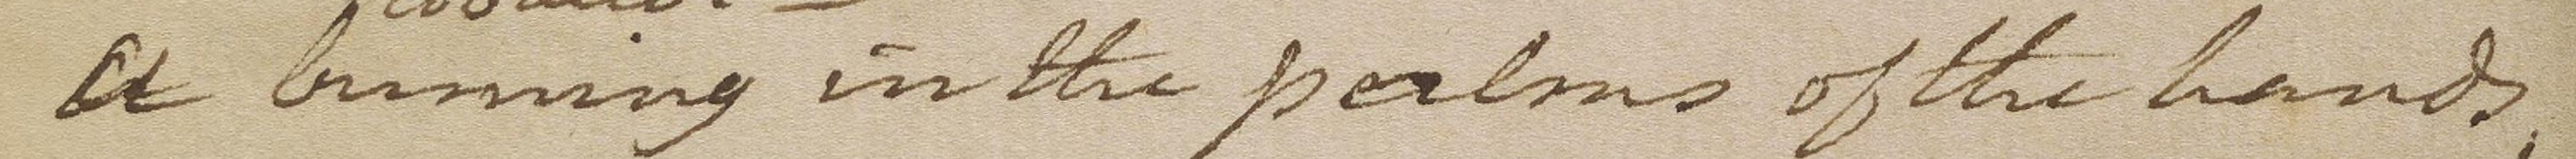A burning in the palms of the hands
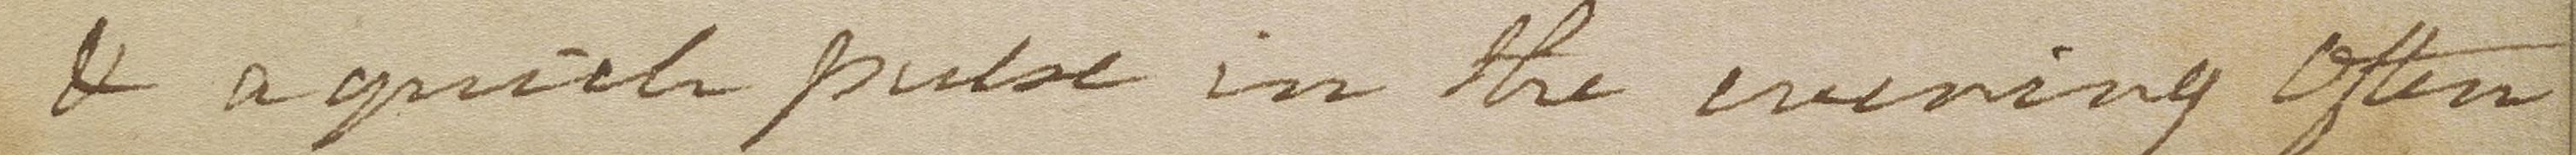& a quick pulse in the evening often
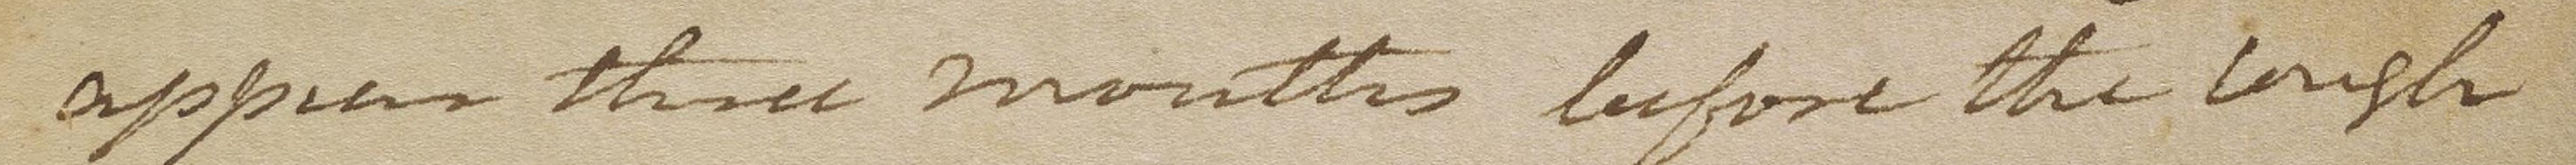appear three months before the cough
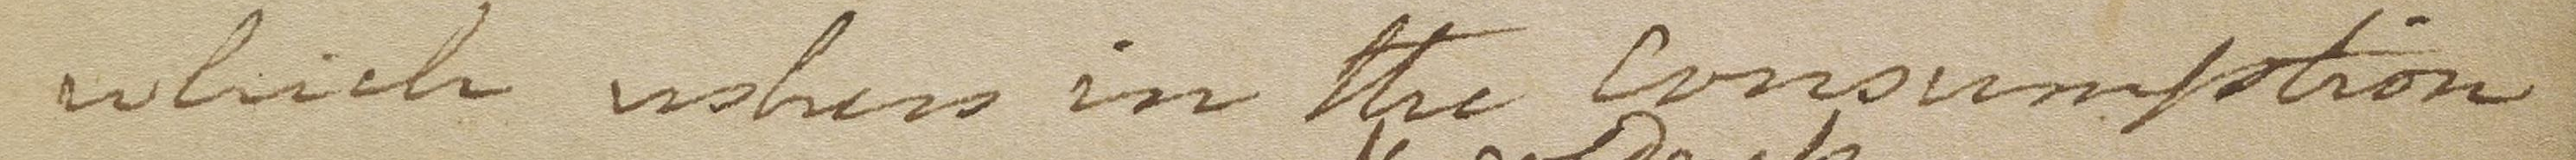which ushers in the consumption
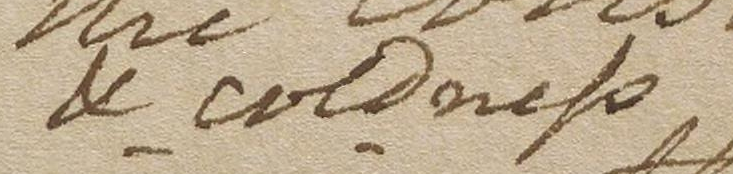& coldness
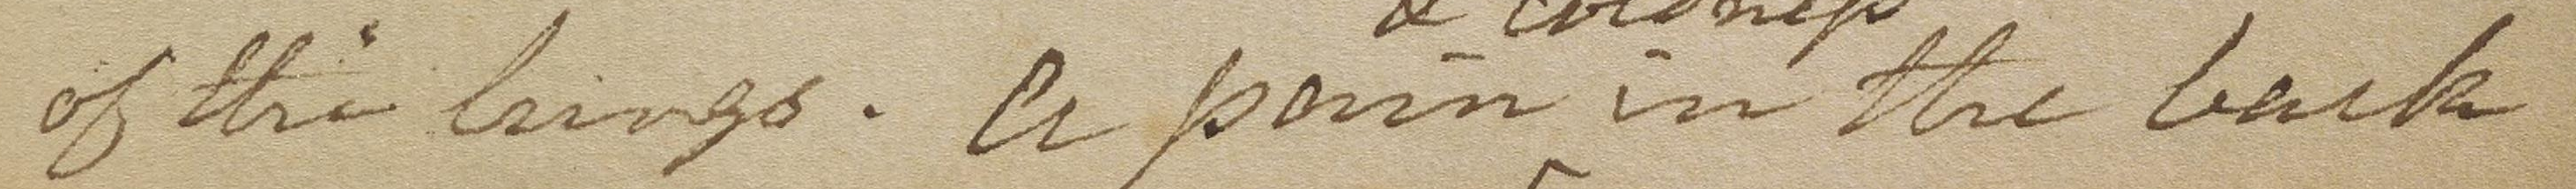of the lungs. A pain ^ in the back
